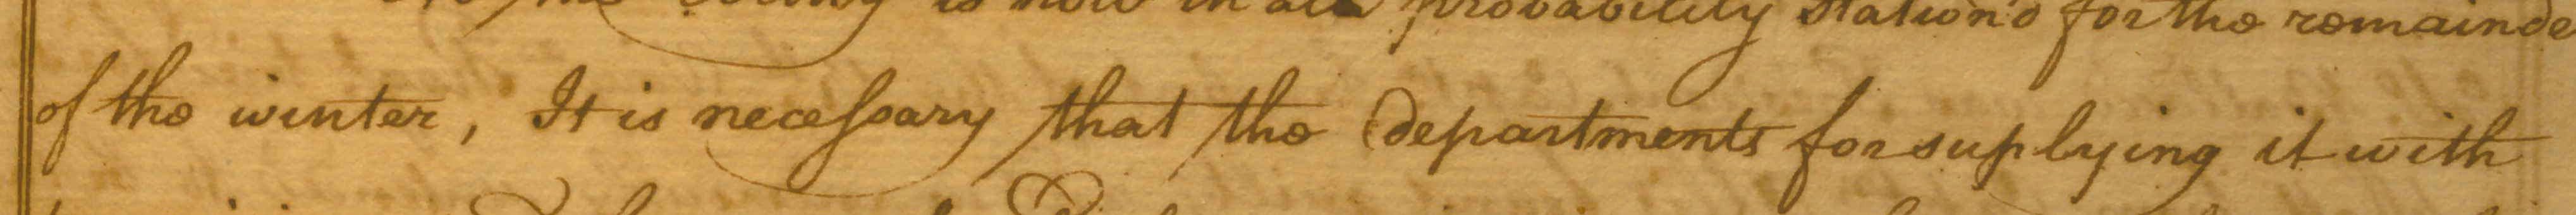of the winter, It is necessary that the departments for suplying it with
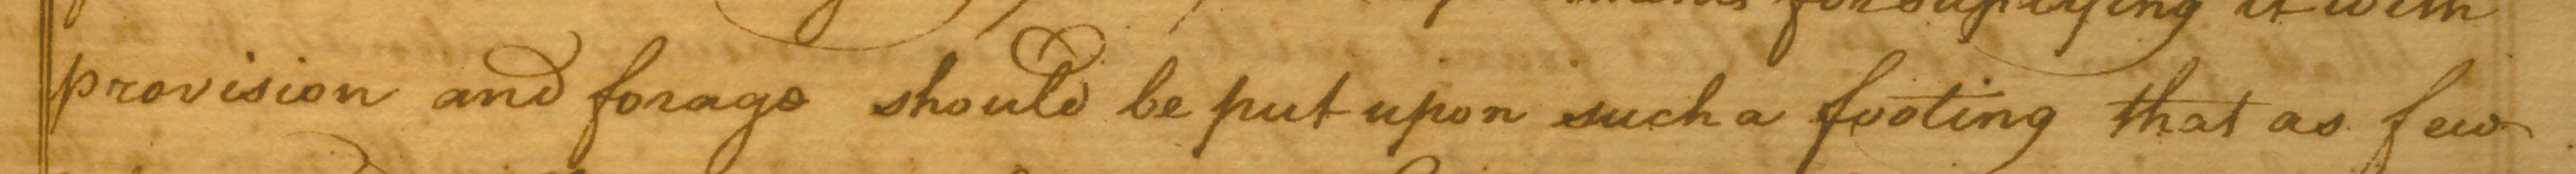provision and forage should be put upon such a footing that as few
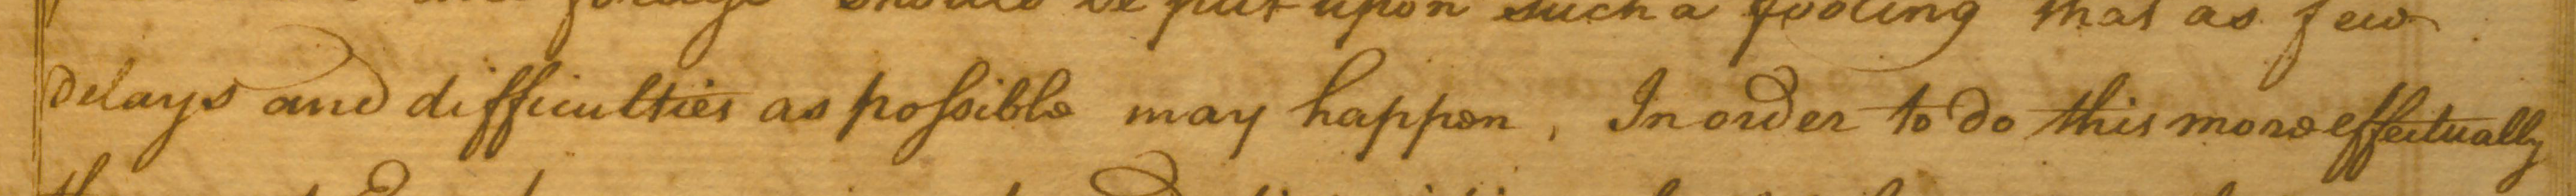delays and difficulties as possible may happen. In order to do this more effectually
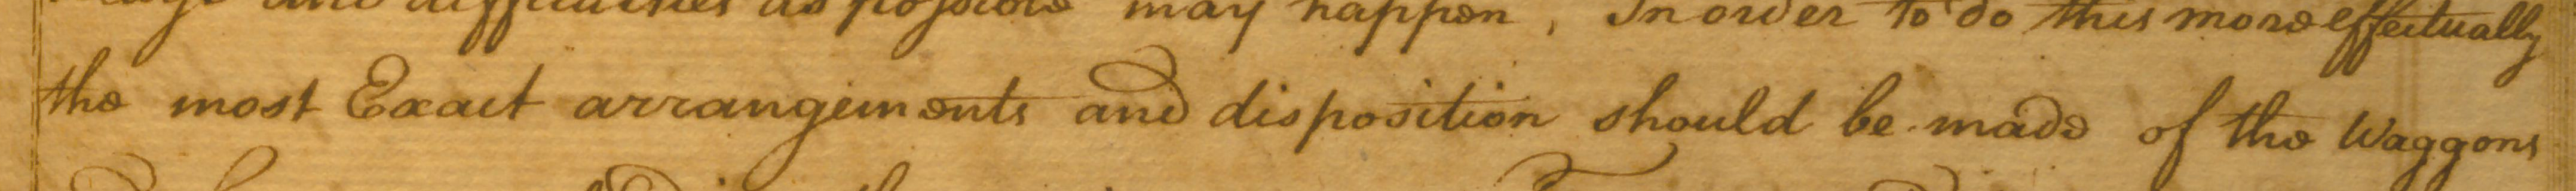the most Exact arrangements and disposition should be made of the Waggons
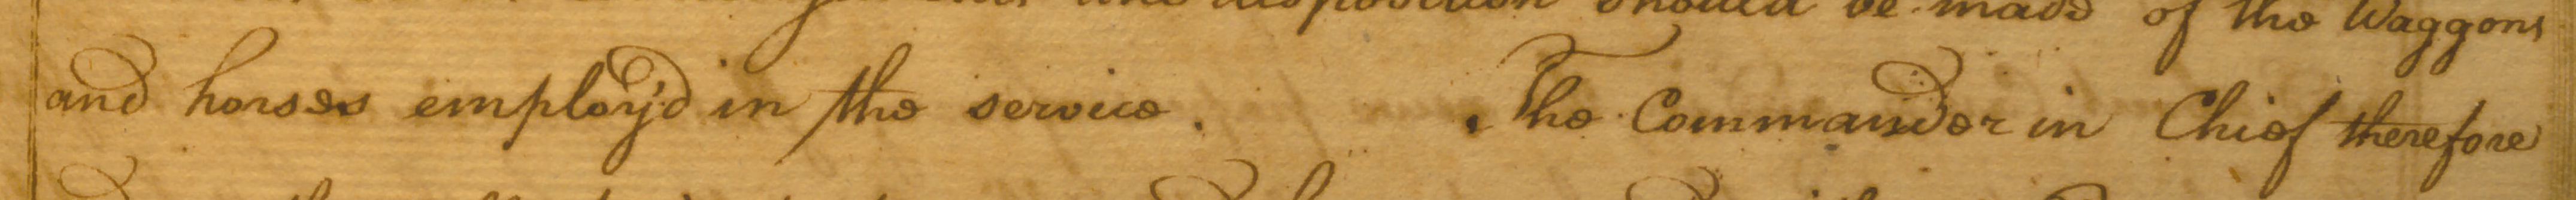and horses employ'd in the service. The Commander in Chief therefore
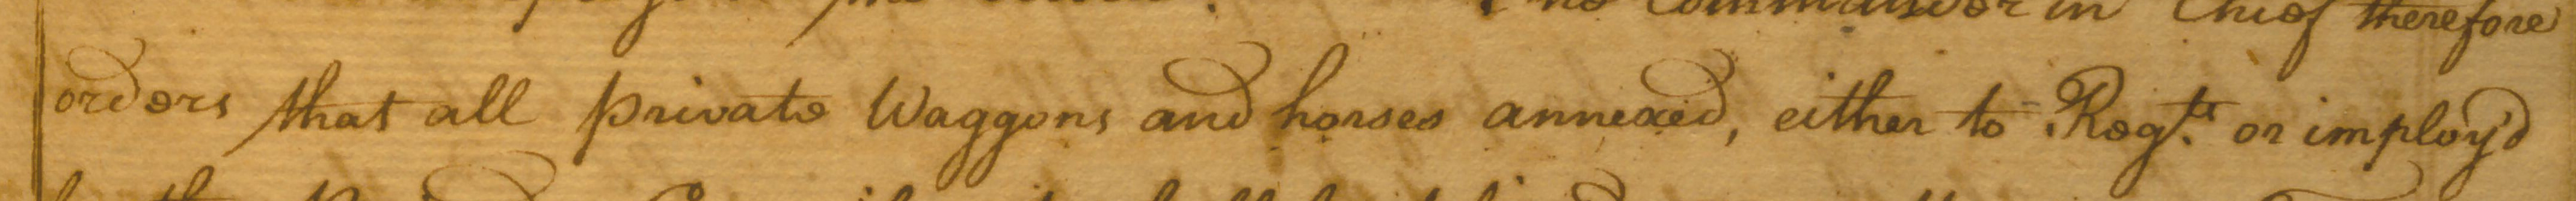orders that all private Waggons and horses annexed, either to Reg^ts. or imploy'd
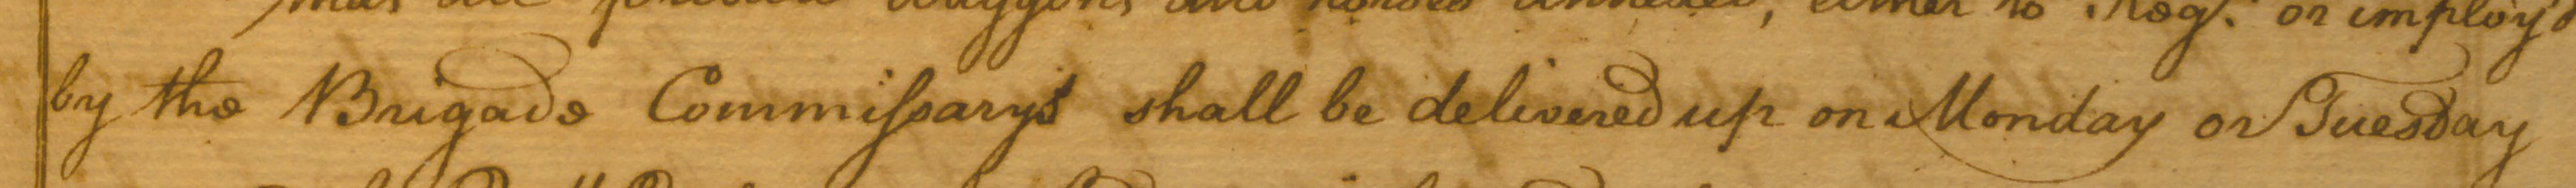by the Brigade Commissarys shall be delivered up on Monday or Tuesday
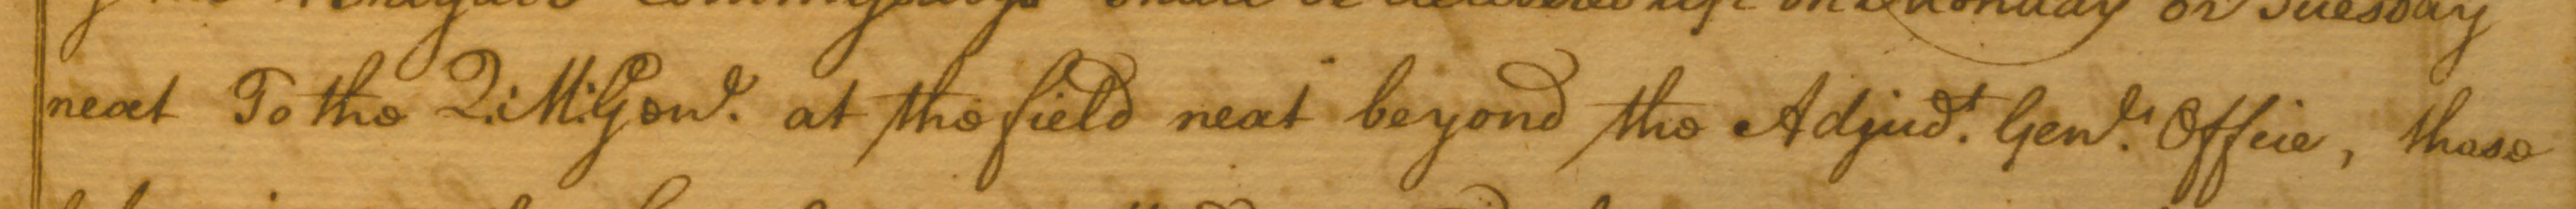next To the Q: M: Gen^l. at the field next beyond the Adjud^t. Gen^ls. Office, those
